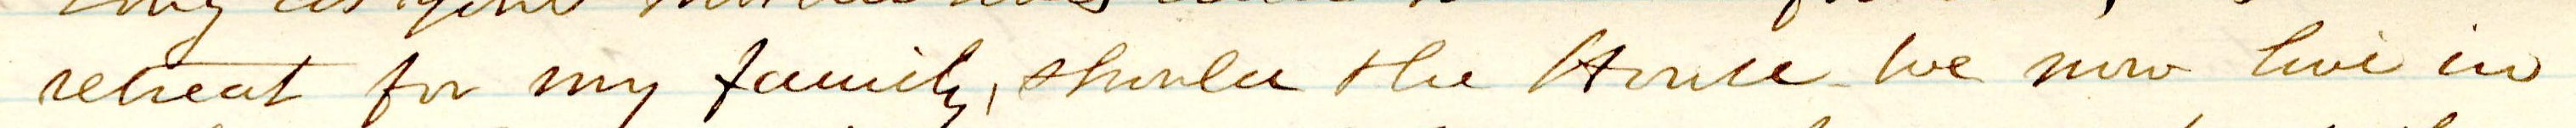retreat for my family, should the House we now live in
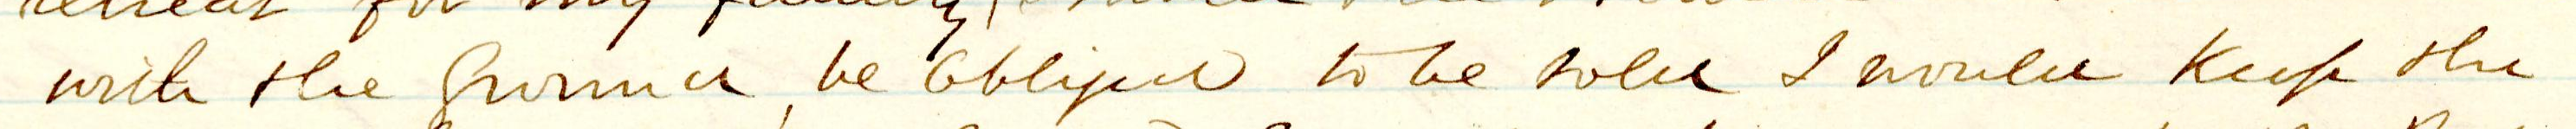with the Ground be oblidged to be sold I would keep the
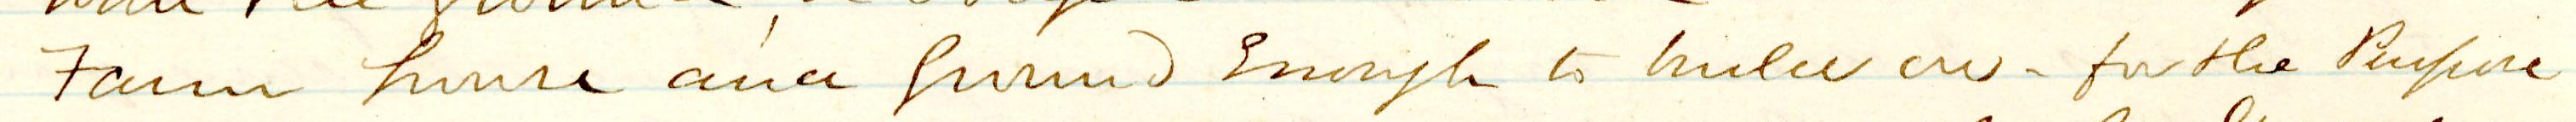Farm house and ground enough to build on- for the Purpose
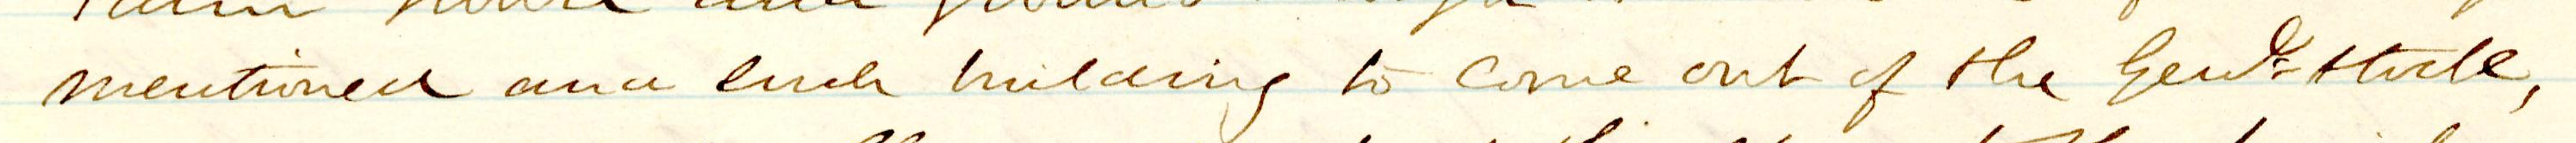mentioned and each building to come out of the Gen^l Hide,
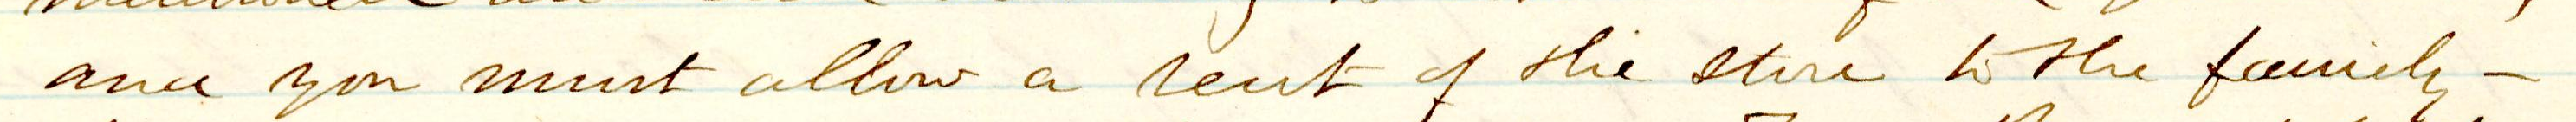and you must allow a rest of the store to thee family-
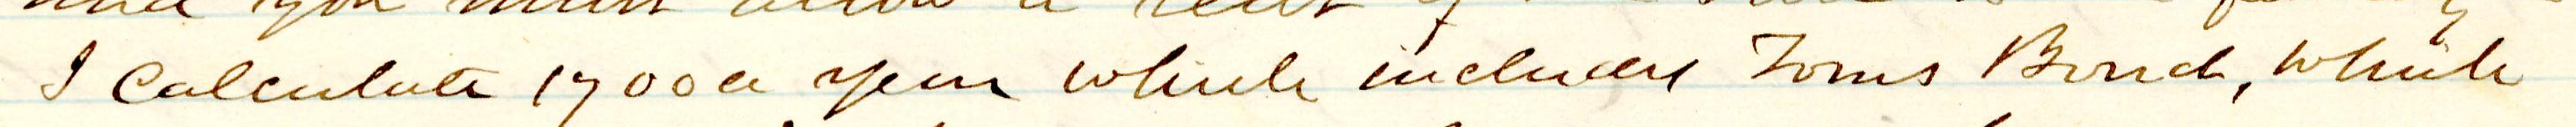I Calculate 1700 a year which includes Toms Bond, which
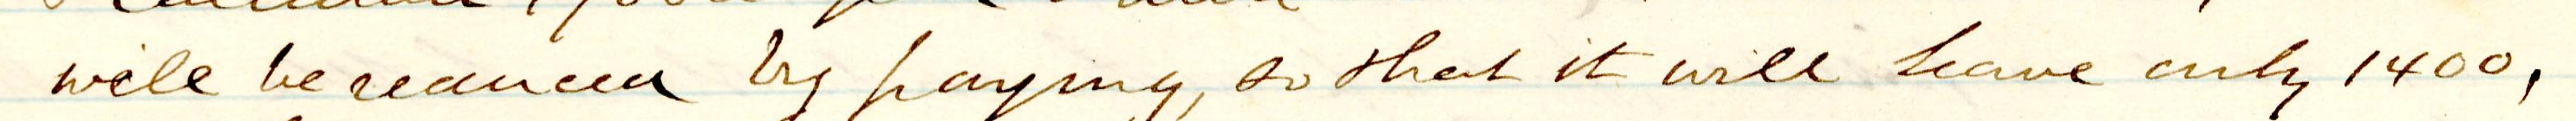will be reduced by paying, so that it will leave only 1400,
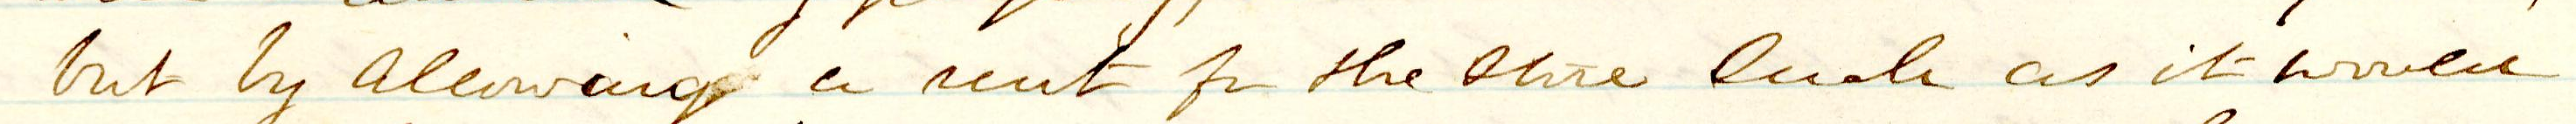but by allowing a rent for the store sale as it would
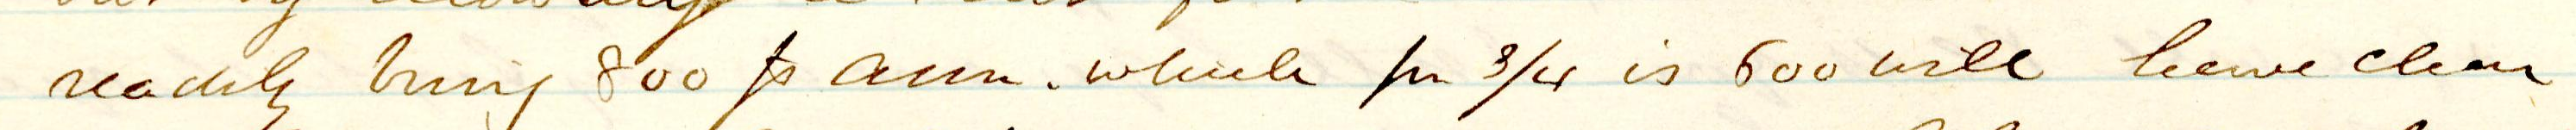readily bring 800 to acres. which per 3/4 is 600 will leave clear
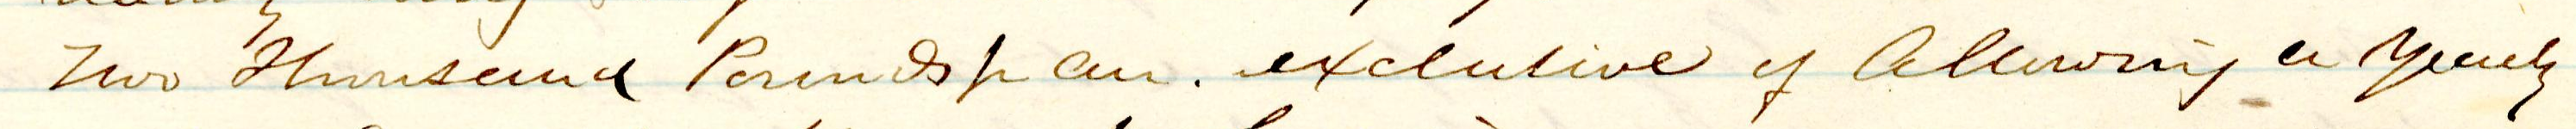two hundred pounds per ac. exclusive of allowing a yearly
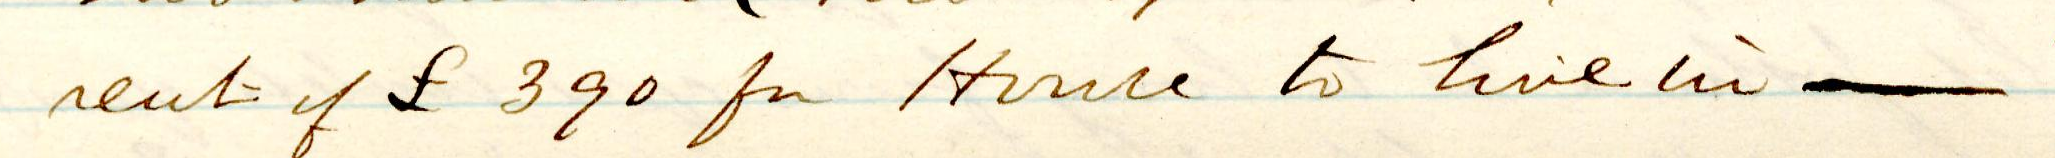rent of £390 per house to live in.-
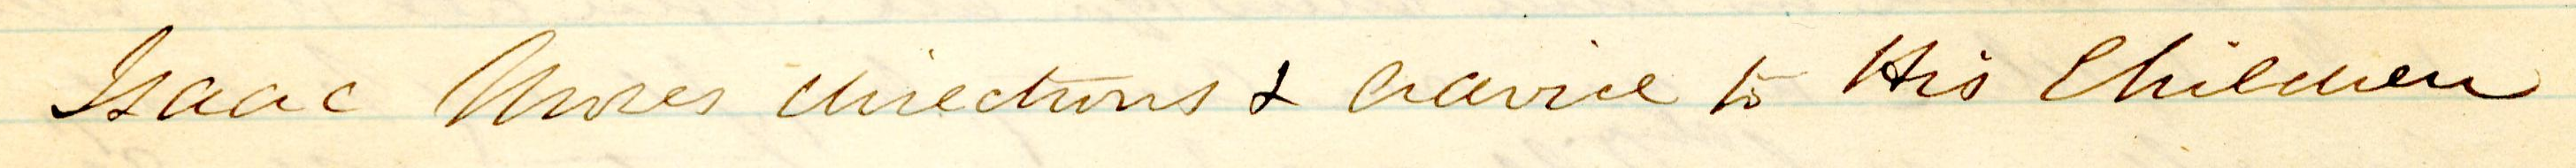Isaac moves directions & advise to his Children
